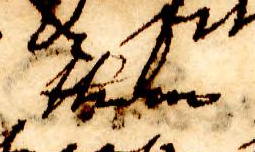them
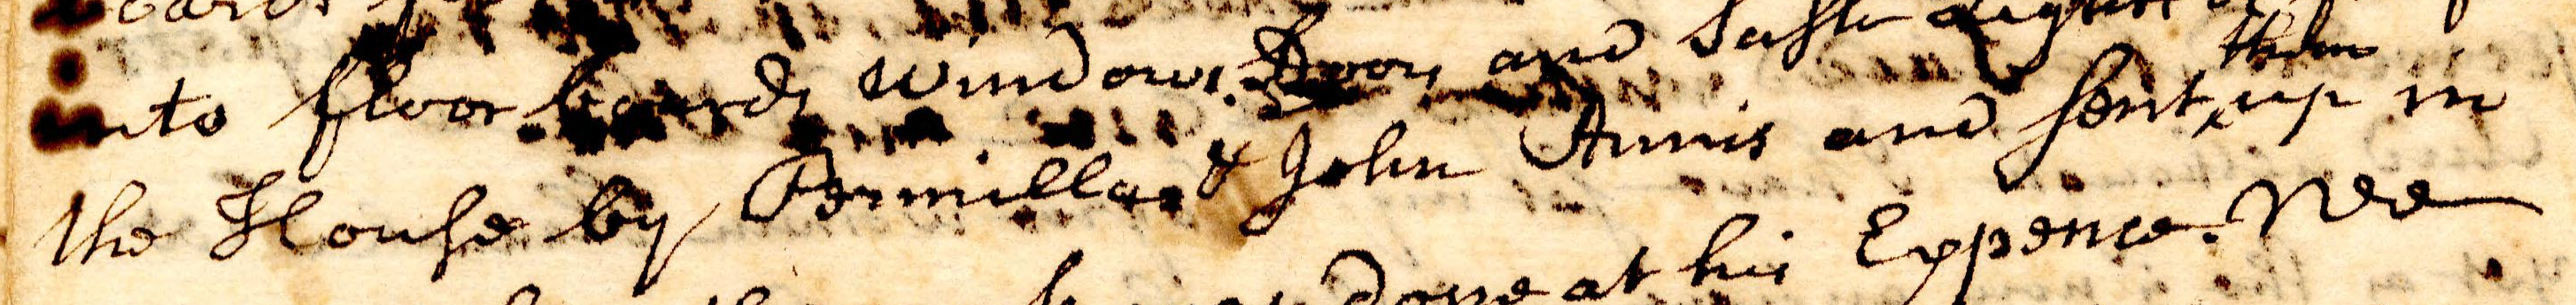the House by Permilla & John Armis and sent ^ up in
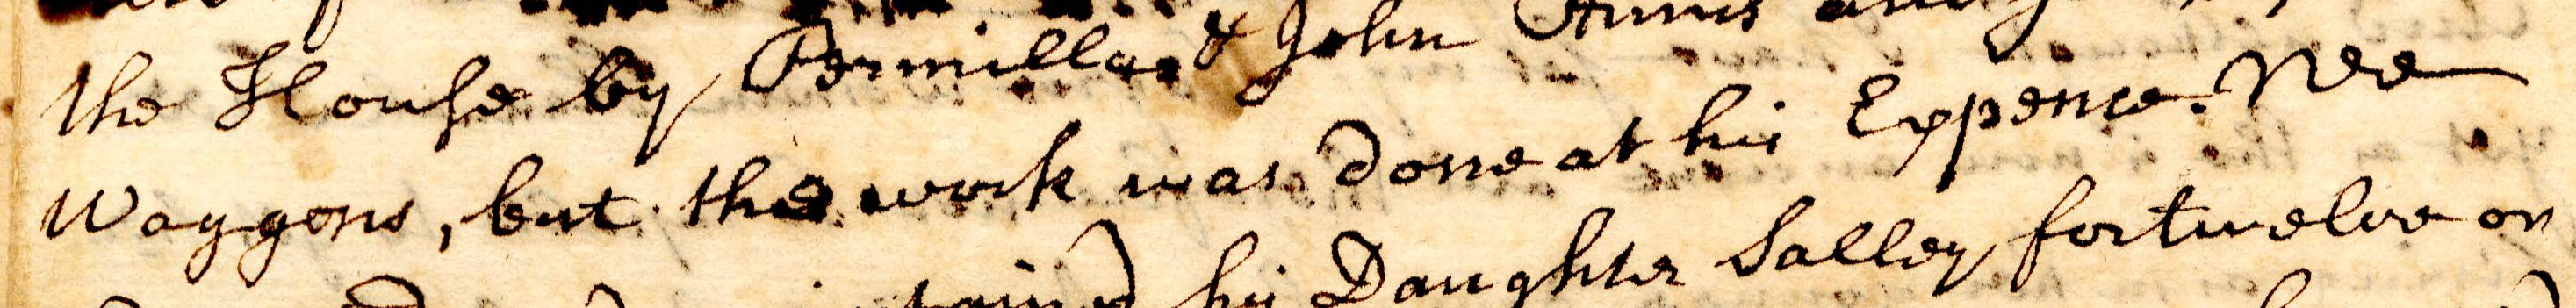Waggons, but the work was done at his Expence. We
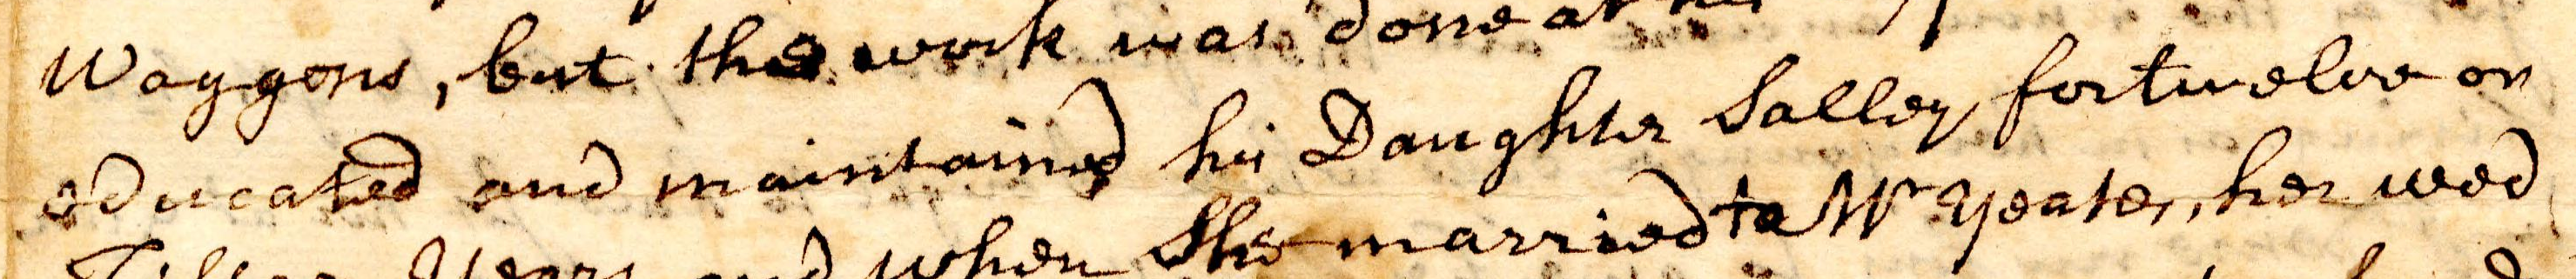educated and maintained his Daughter Salley for twelve or
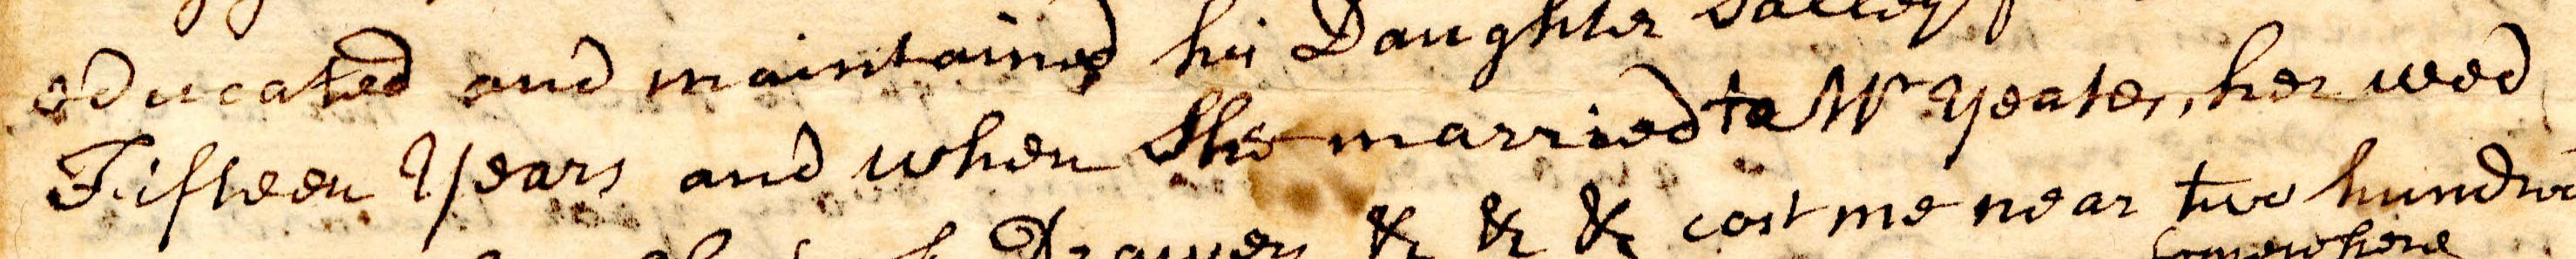Fifteen Years and when she married to M^r Yeates, her wed
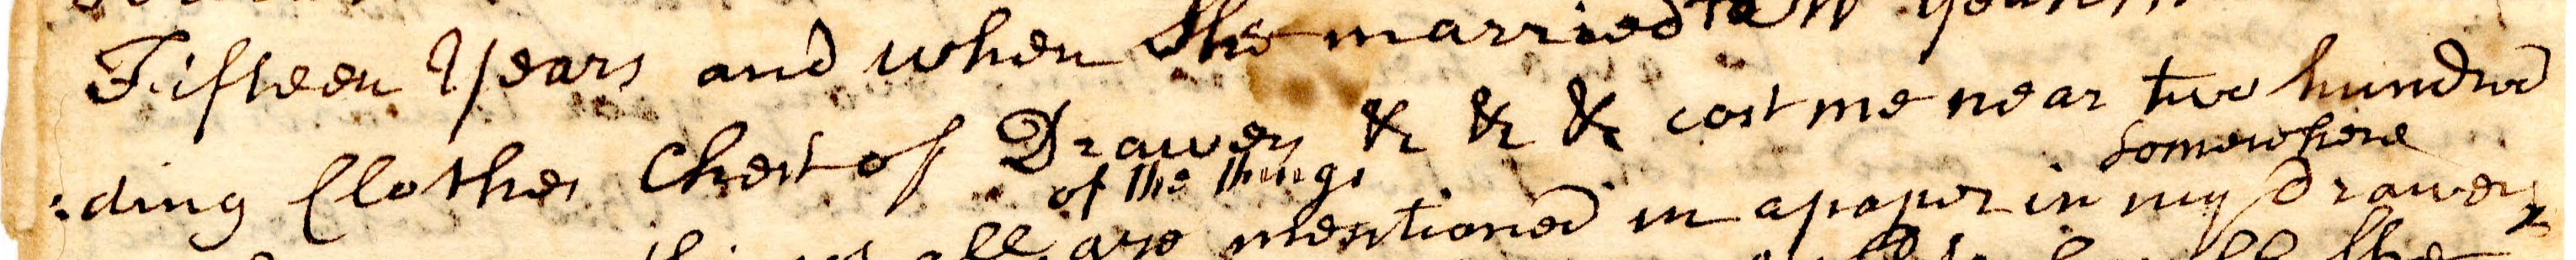:ding Clothes Chest of Drawers &c &c &c cost me near two hundred
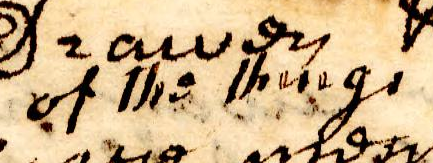of the things
